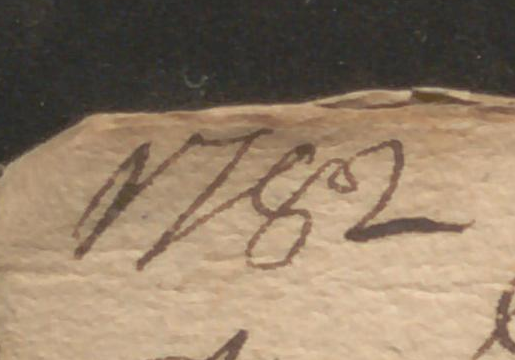1782
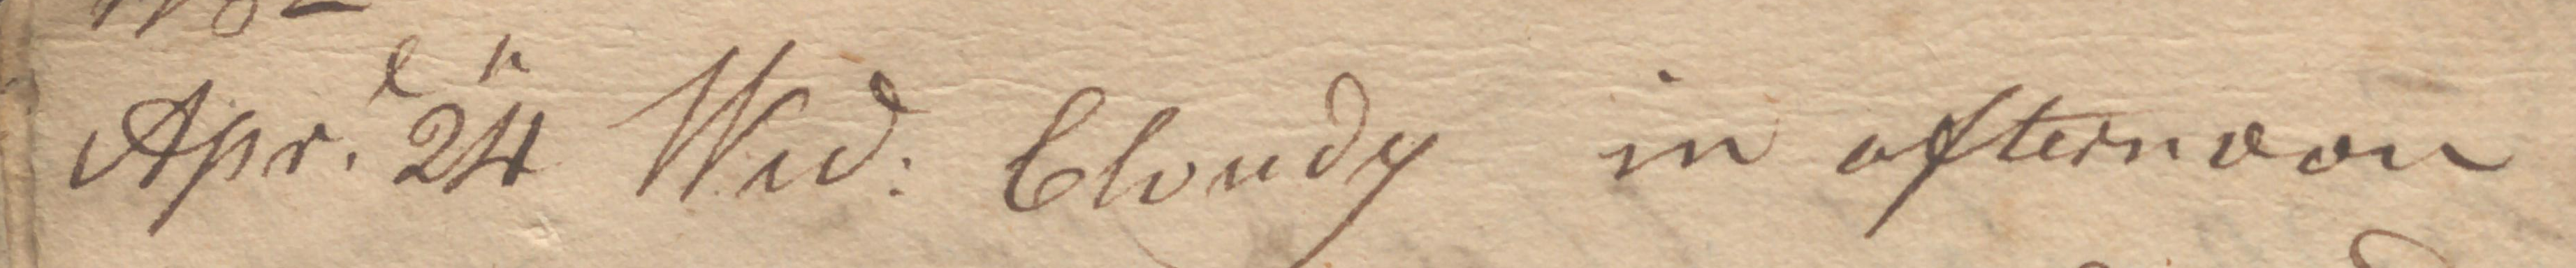Apr^l. 24^h Wed: Cloudy in afternoon
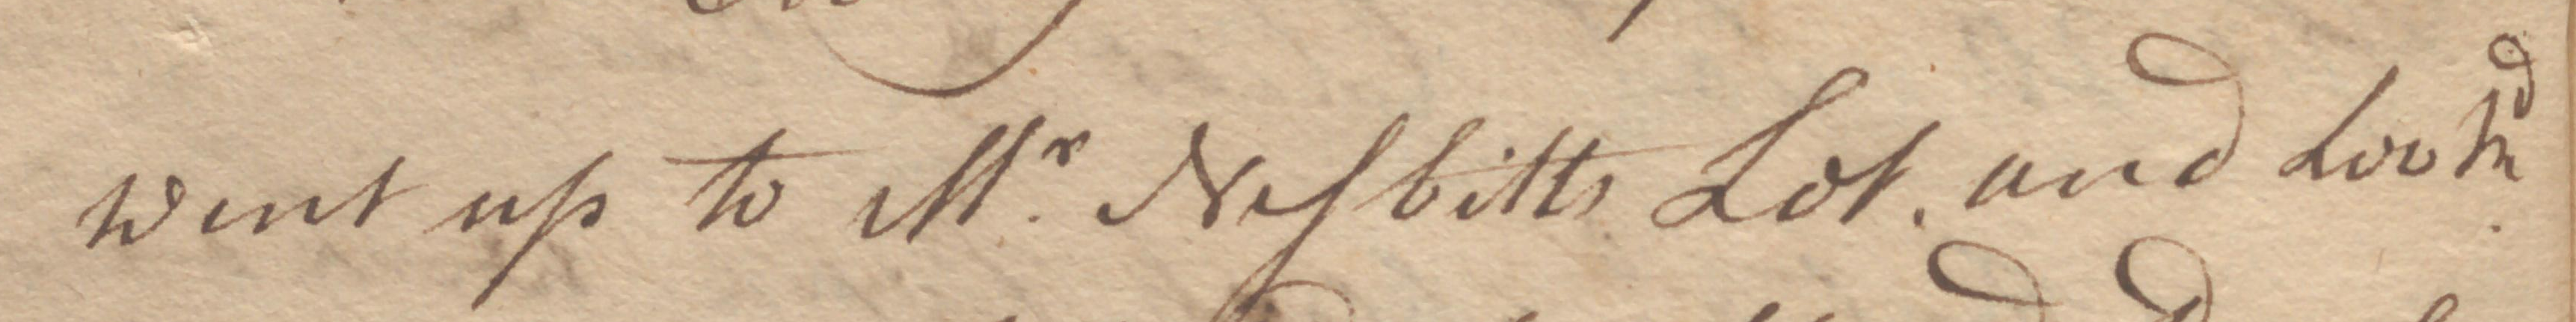went up to M^r. Nesbitts Lot, and Look^d
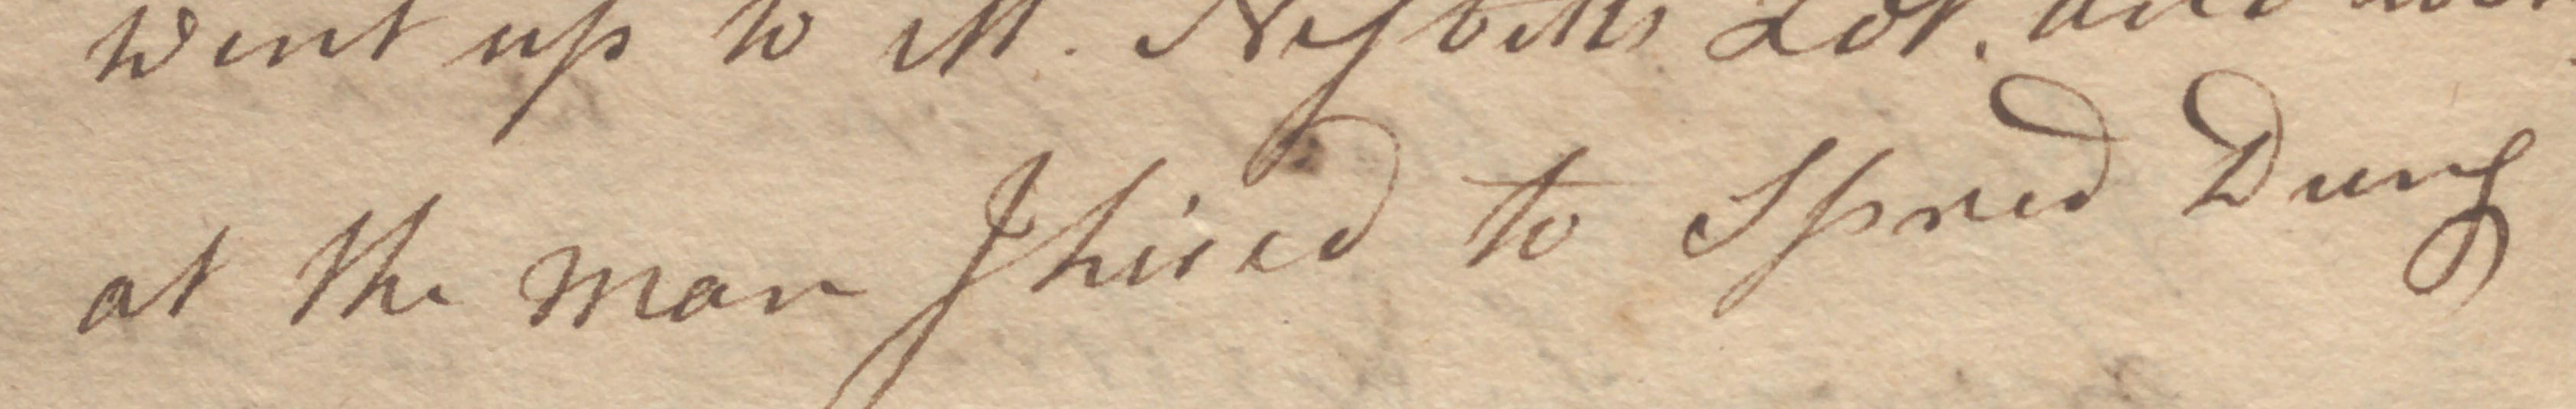at the man I hired to spred Dung
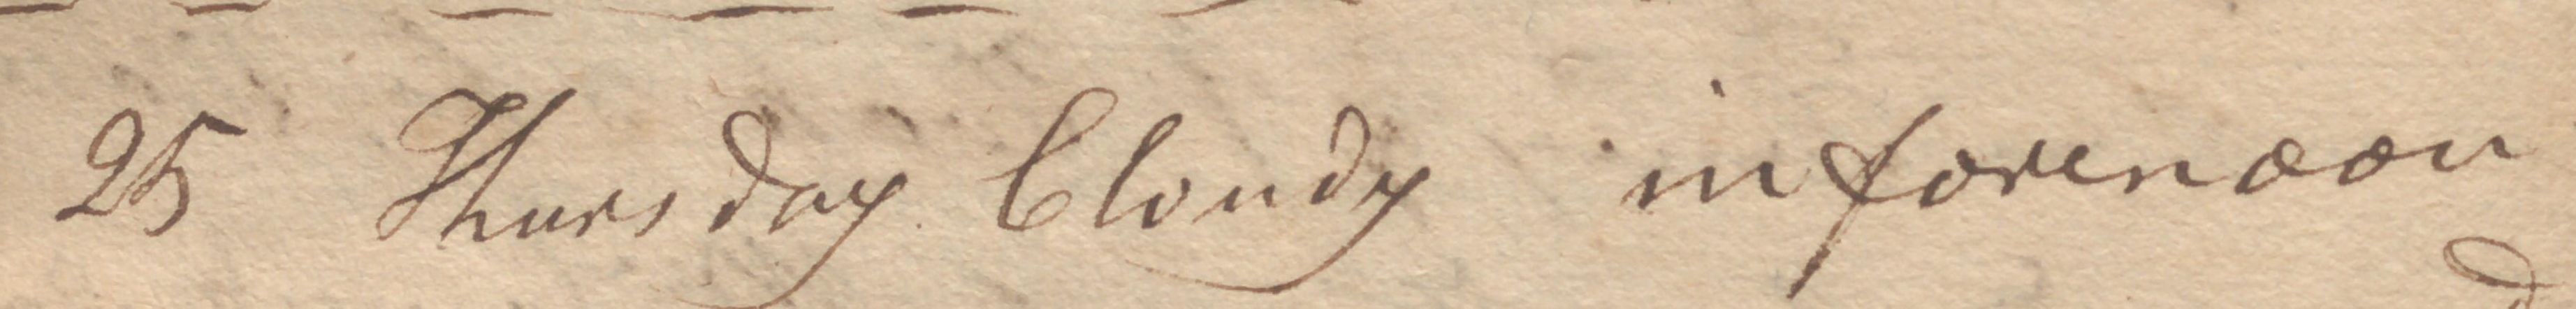25 Thursday Cloudy in forenoon
